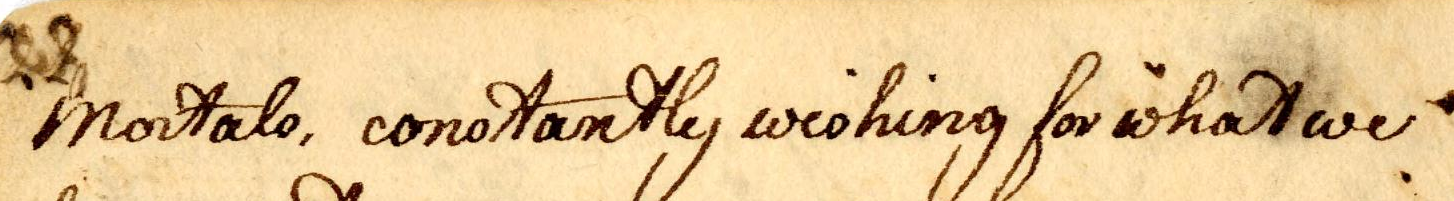Mortals, constantly wishing for what we
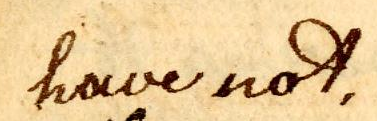have not.
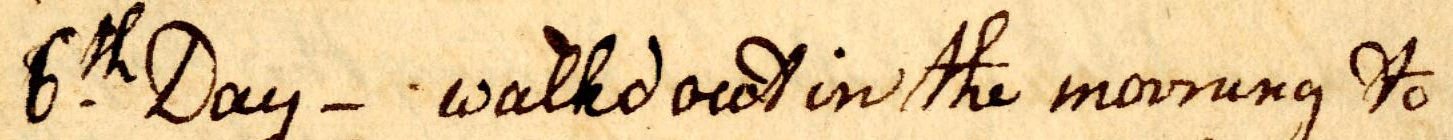6^th Day- walkd out in the morning to
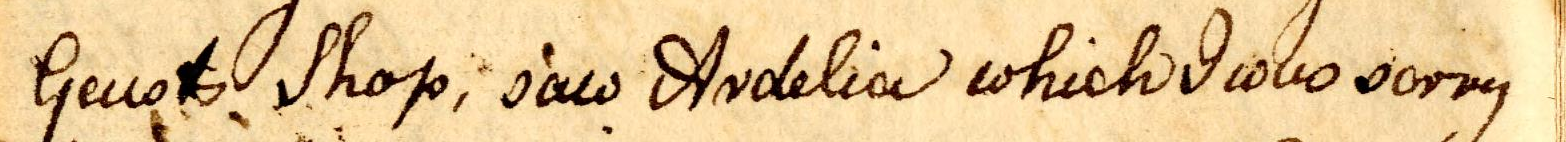Geusts Shops, saw Ardelia which I was sorry
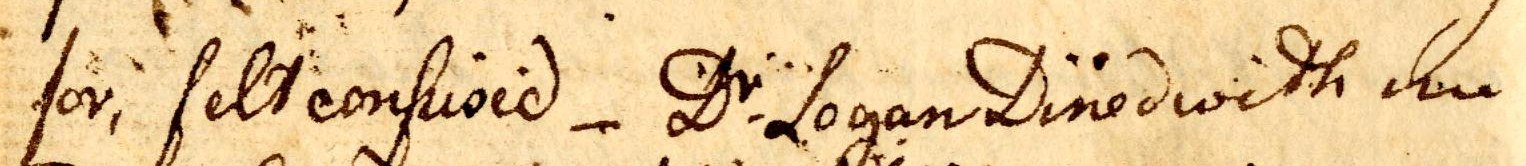for, felt confused- D^r Logan Dined with me
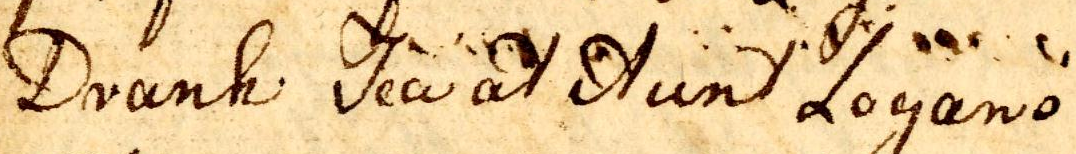Drank Tea at Aunt Logans
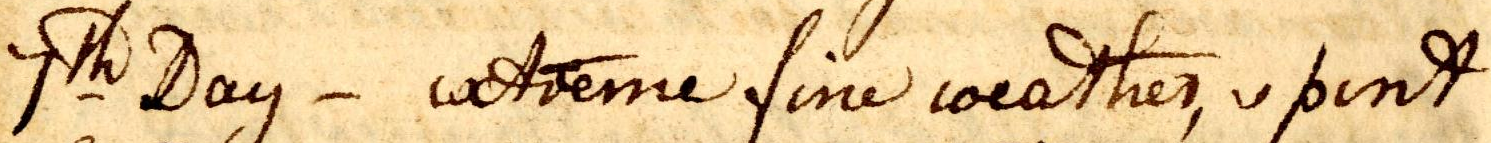7^th Day- extreme fine weather, spent
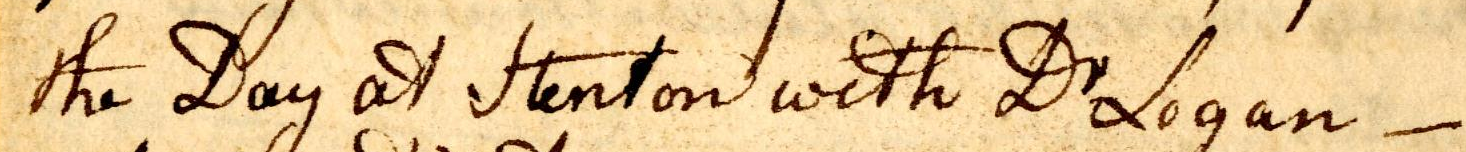the Day at Stenton with D^r Logan-
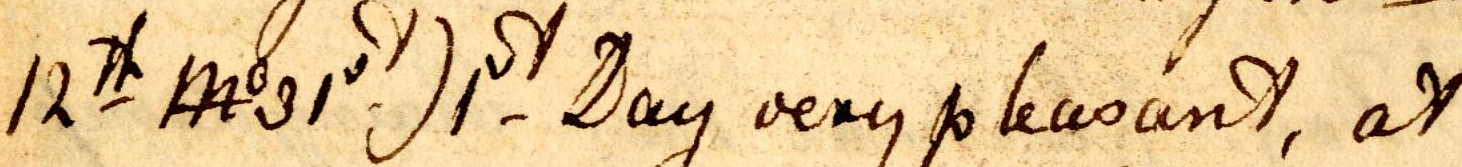12^th M^o 31^st) 1^st Day very pleasant, at
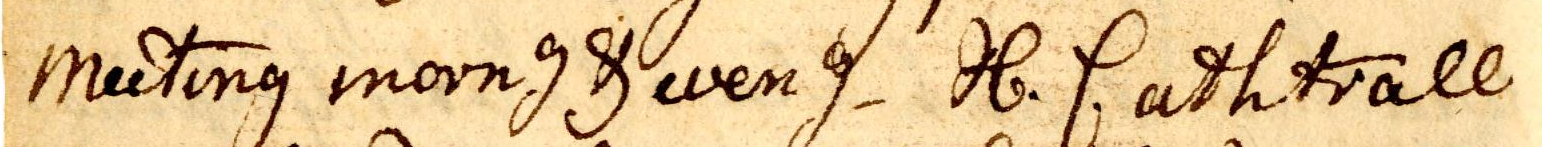meeting morn^g & even^g- H. Cathtrall
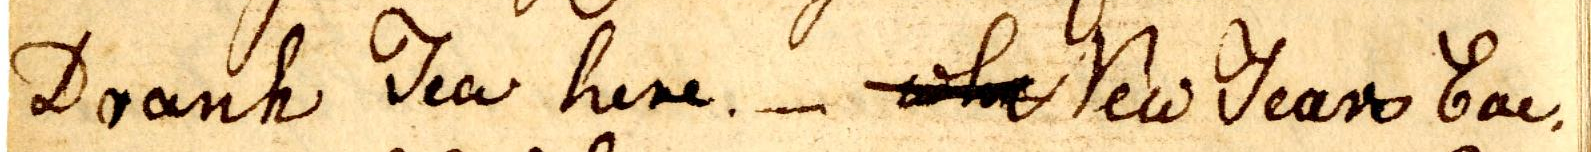Drank Tea here.- [whe] New Years Eve.
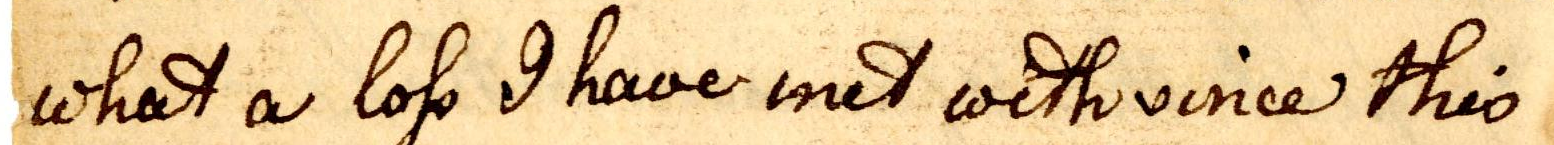what a loss I have met with since this
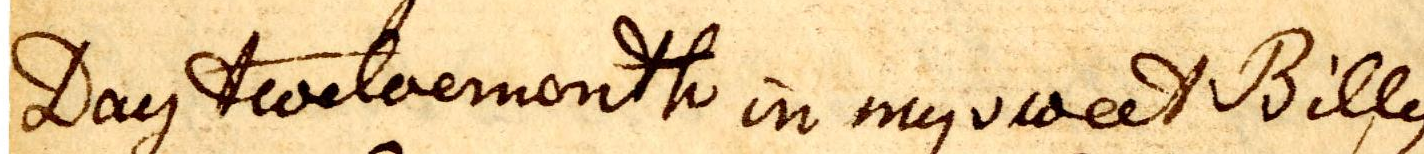Day twelvemonth in my sweet Billy
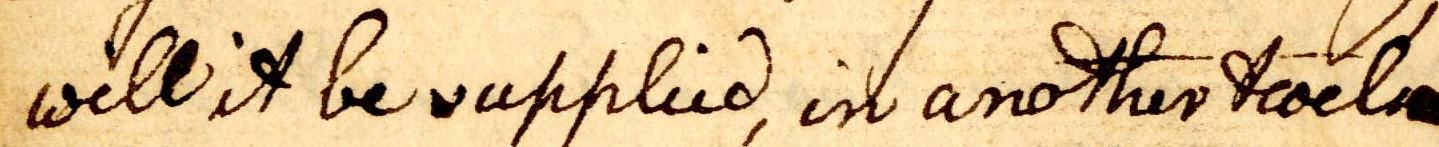will it be supplied, in another twel[_]
